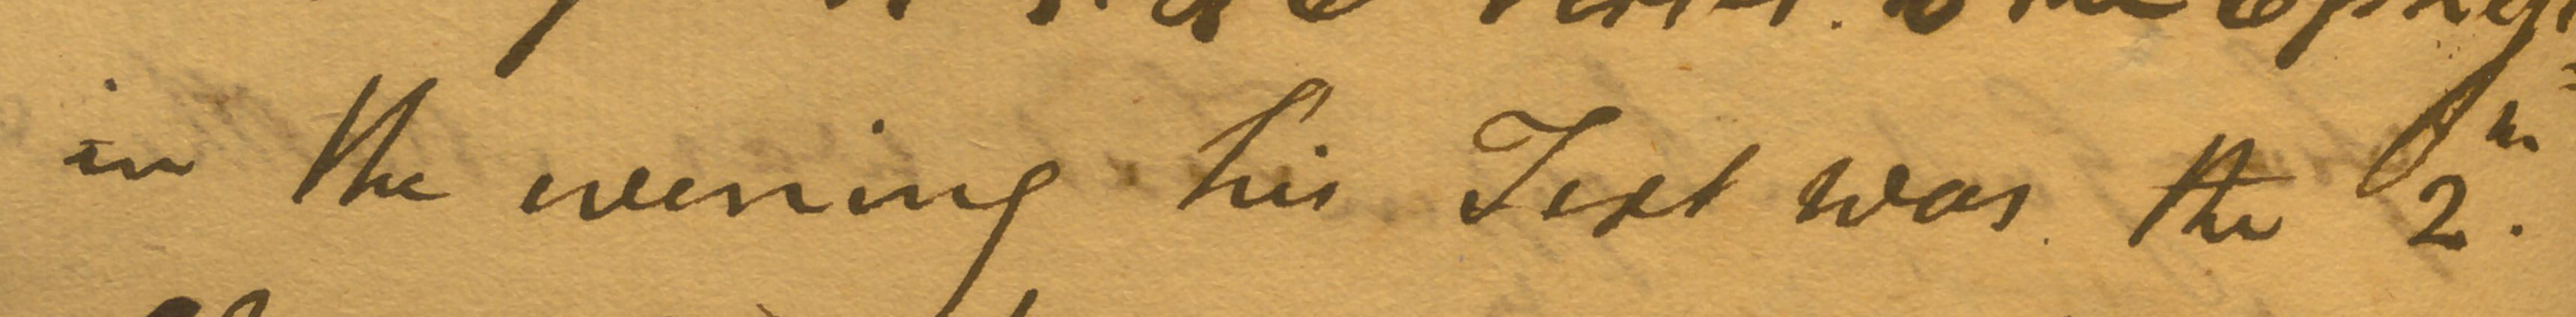in the evening his Text was the2^th
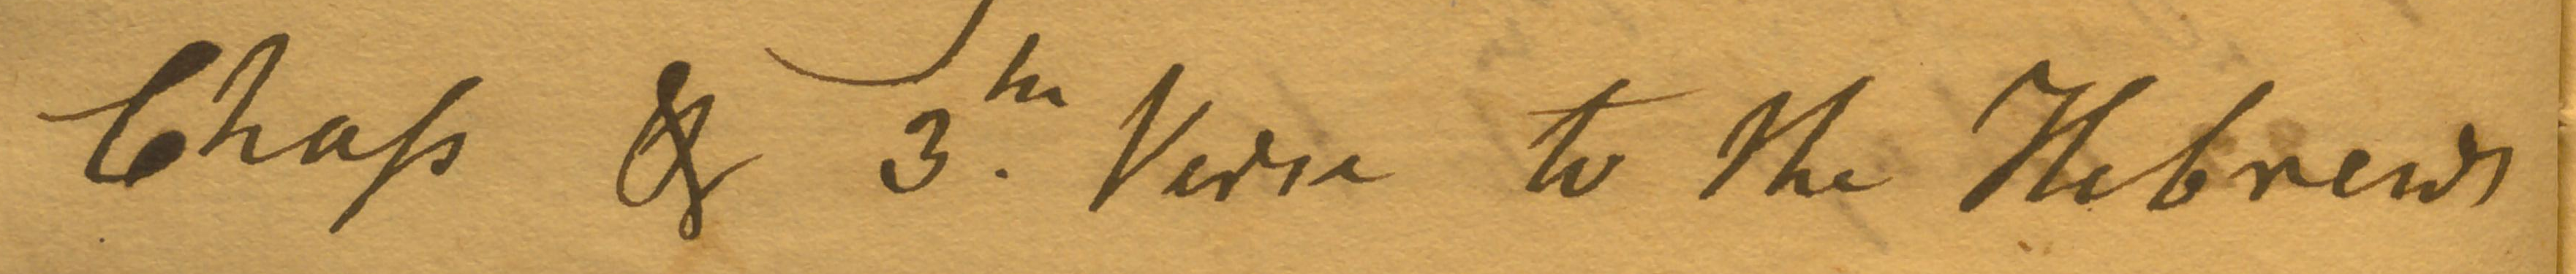Chap & 3^th. Verse to the Hebrews
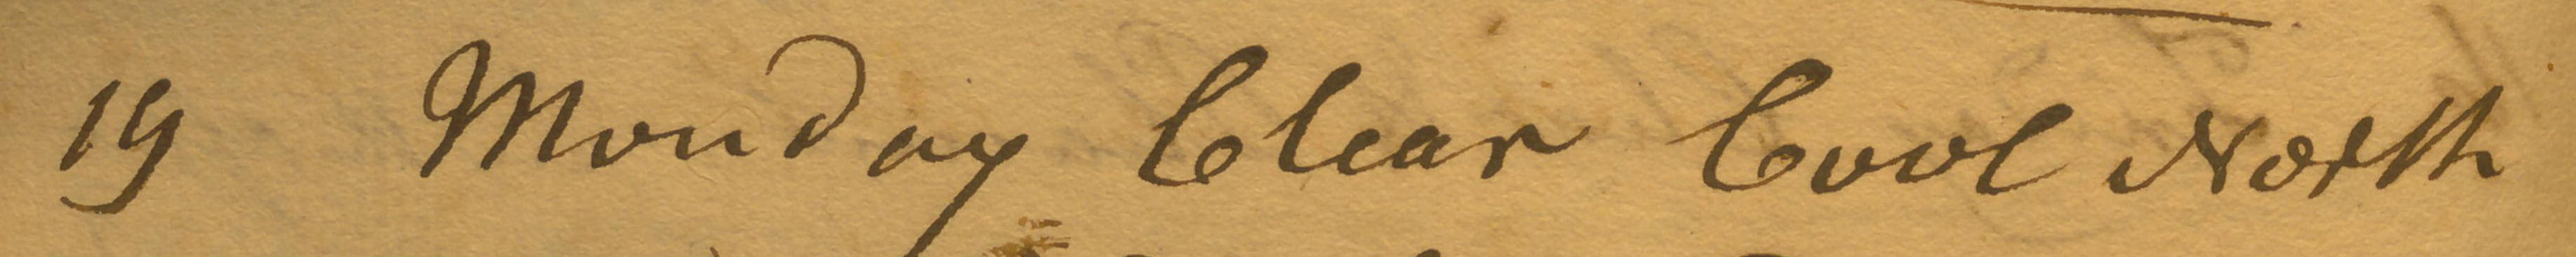19 Monday Clear Cool North
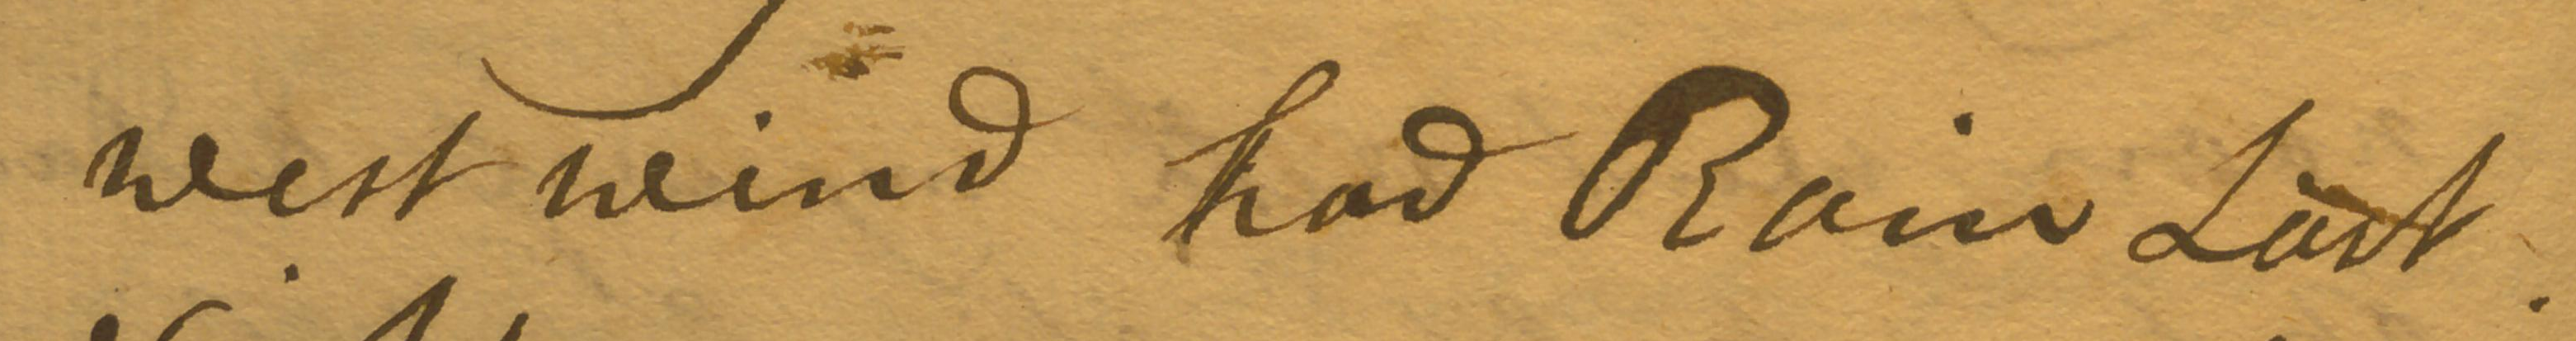west wind had Rain Last
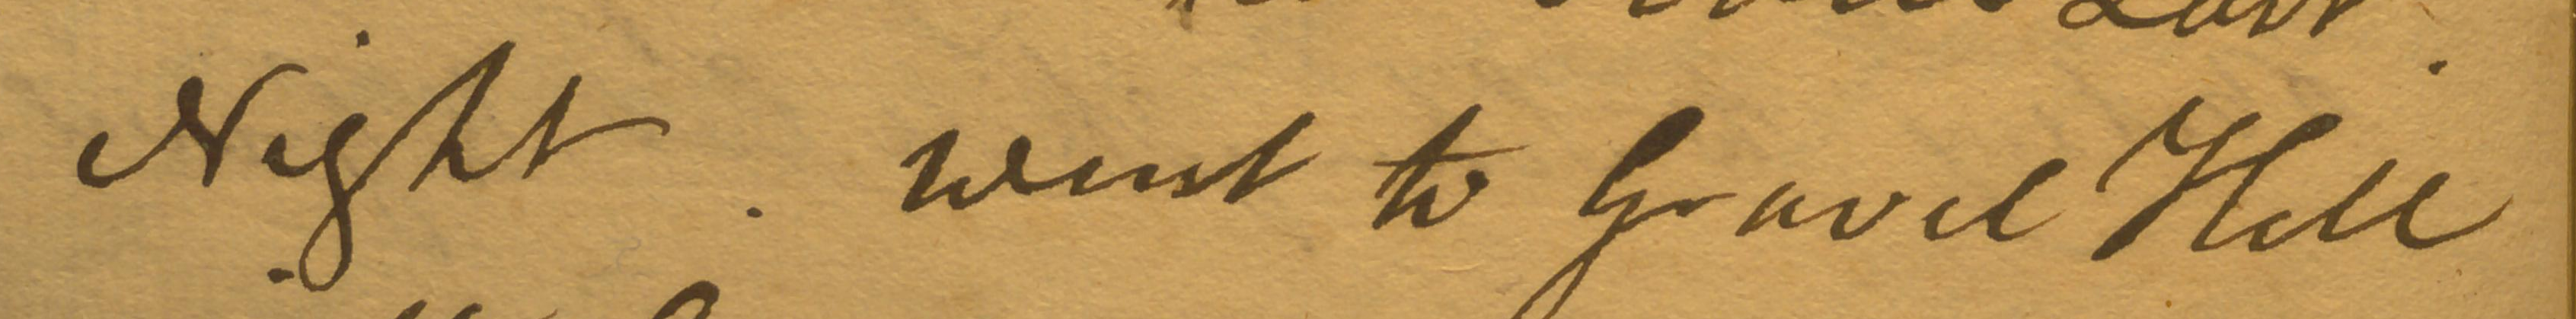Night went to Gravel Hill
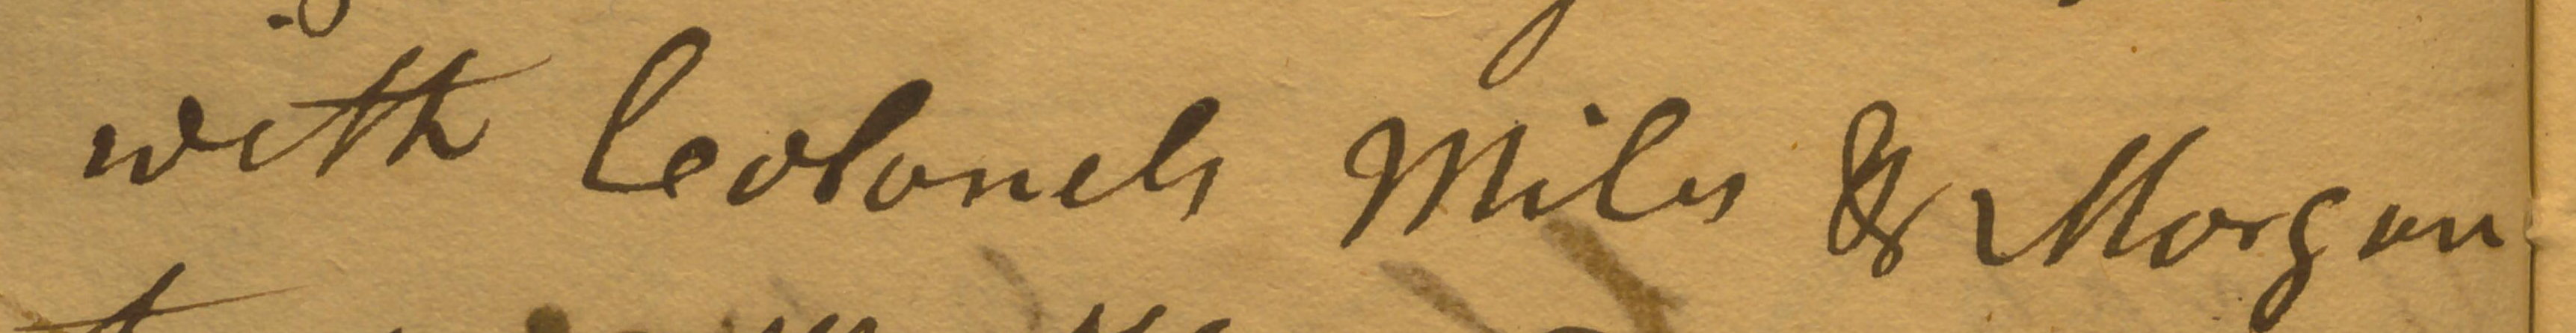with Colonels Miles & Morgan
